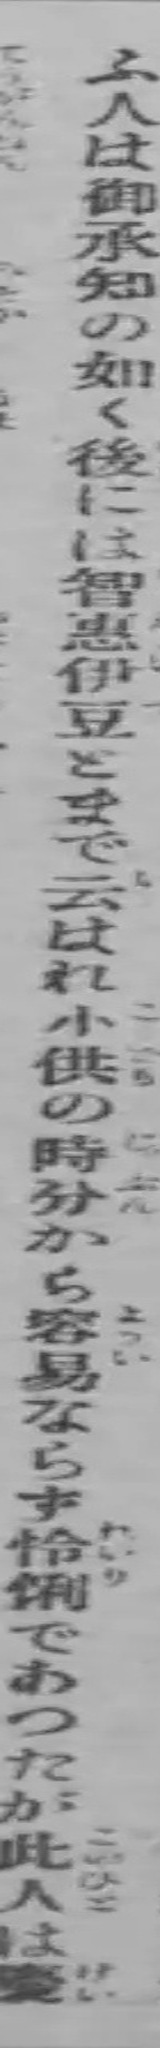ふ人は御承知の如く後には智恵伊豆とまで云はれた小供の時分から容易ならず怜悧であつたが此人は慶
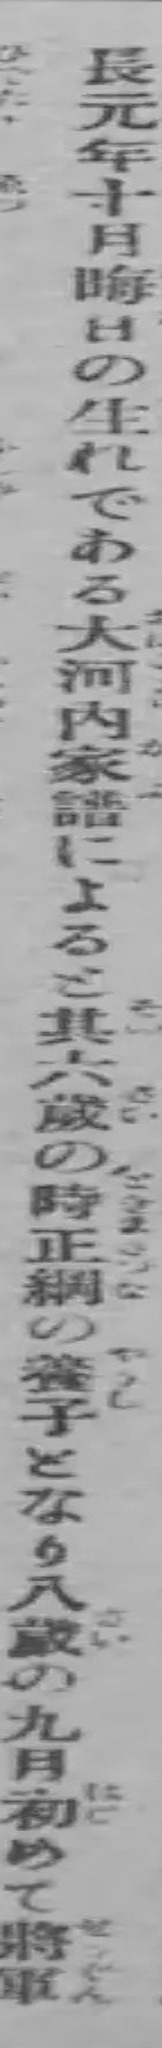長元年十月晦日の生れである大河内家譜によると其六歳の時正綱の養子となり八歳の九月初めて将軍
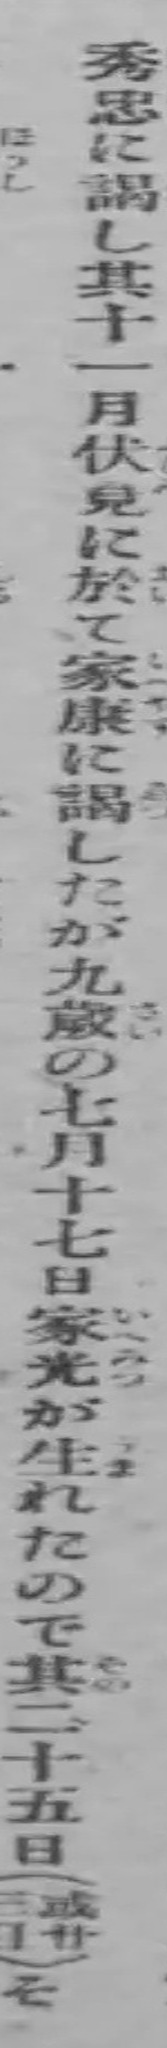秀忠に謁し其十一月伏見に於て家康に謁したが九歳の七月十七日家光が生れたので其二十五日(或廿三日)そ
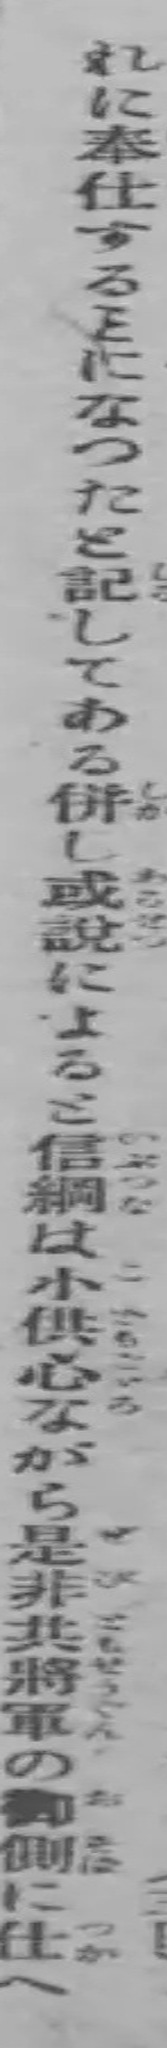れに奉仕することになつたと記してある併し或説によると信綱は小供心ながら是非共将軍の御側に仕へ
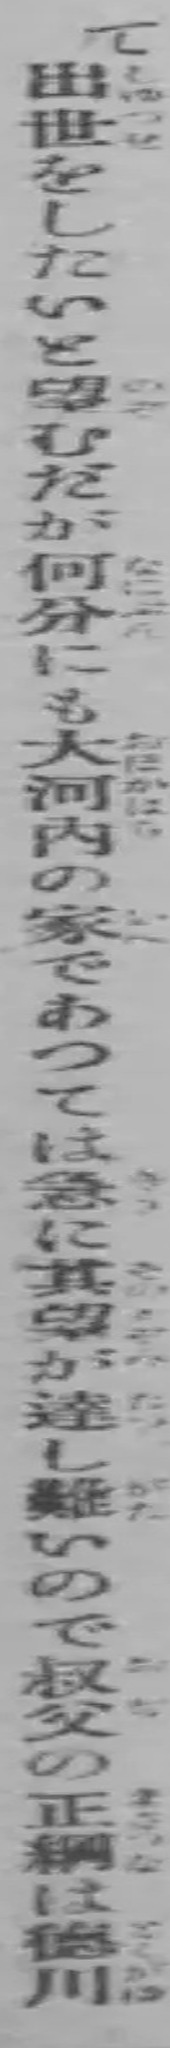て出世をしたいと望むだが何分にも大河内の家であつては急に其望が達し難いので叔父の正綱は徳川
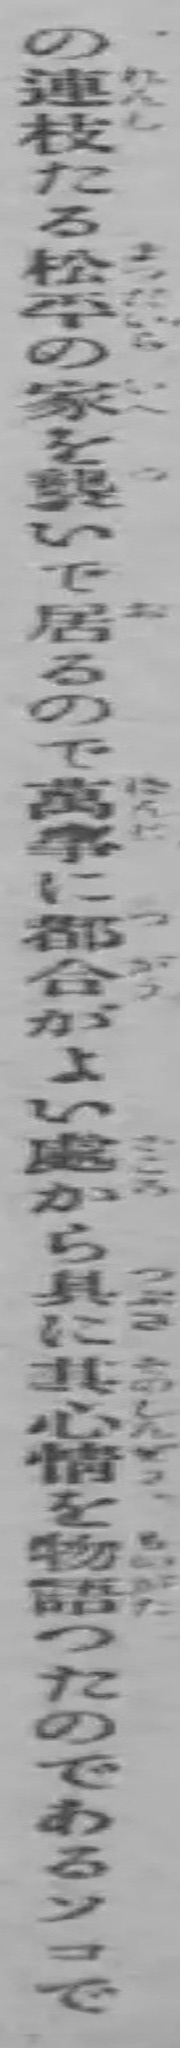の連枝たる松平の家を襲いで居るので万事に都合がよい処から具に其心情を物語つたのであるソコで
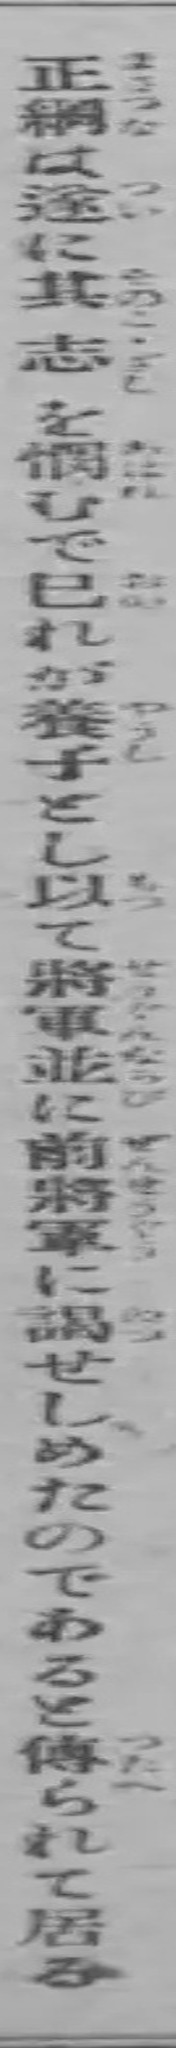正綱は遂に其志を憫むで巳れが養子とし以て将軍並に前将軍に謁せしめたのであると伝られて居る
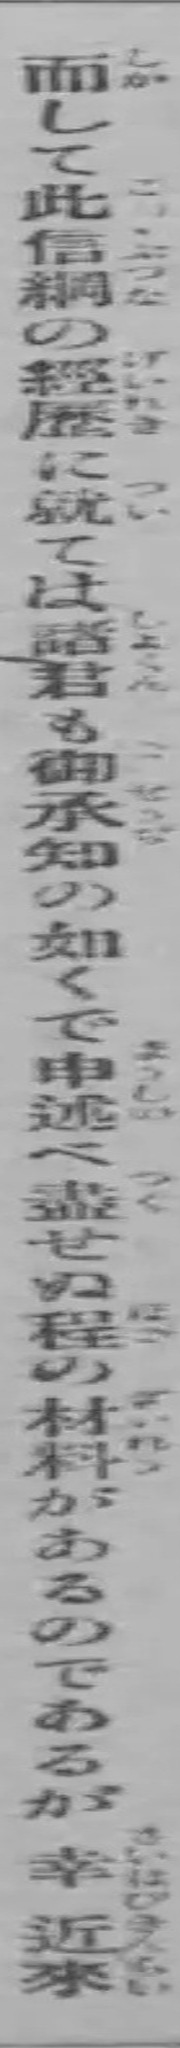信綱の伝記而して此信綱の経歴に就ては諸君も御承知の如くで申述べ尽せぬ程の材料があるのであるが幸近来
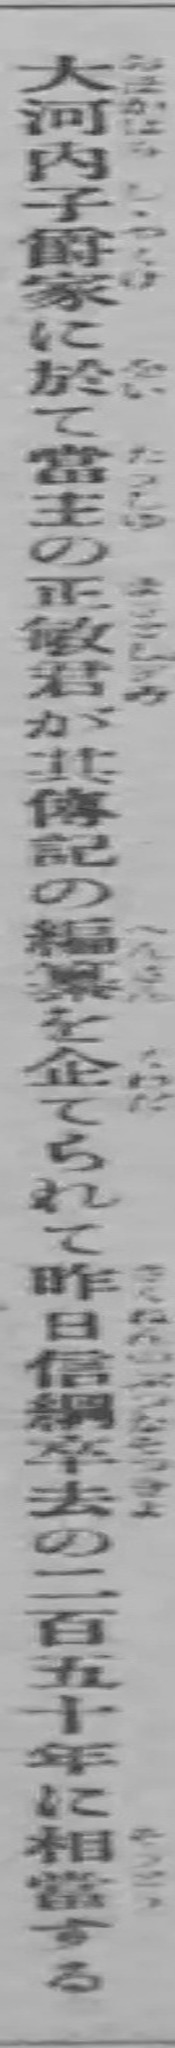大河内子爵家に於て当主の正敏君が其伝記の編纂を企てられて昨年信綱卒去の二百五十年に相当する
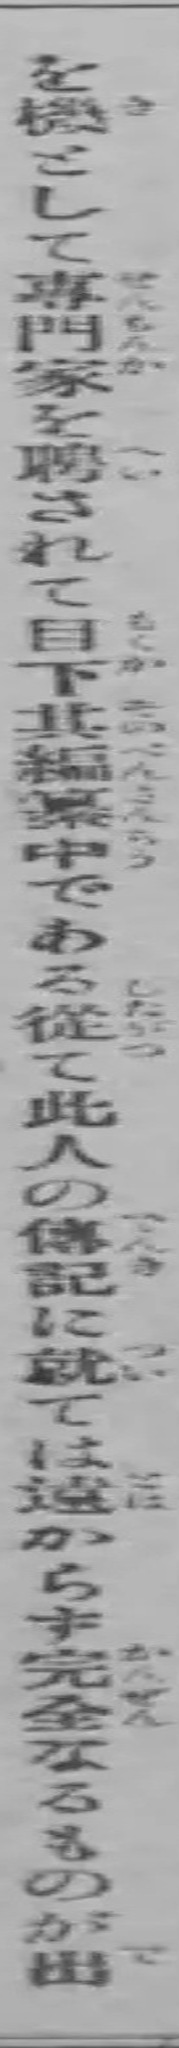を機として専門家を聘されて目下其編纂中である従て此人の伝記に就ては遠からず完全なるものが出
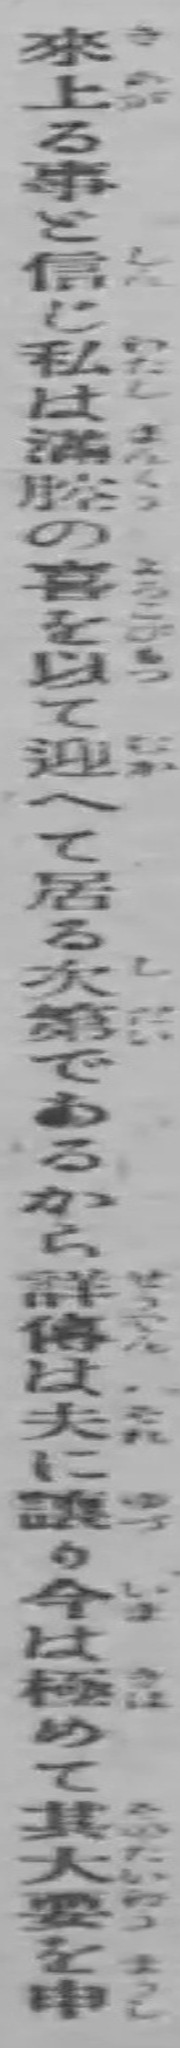来上る事と信じ私は満腔の喜を以て迎へて居る次第であるから詳伝は夫に譲り今は極めて其大要を申
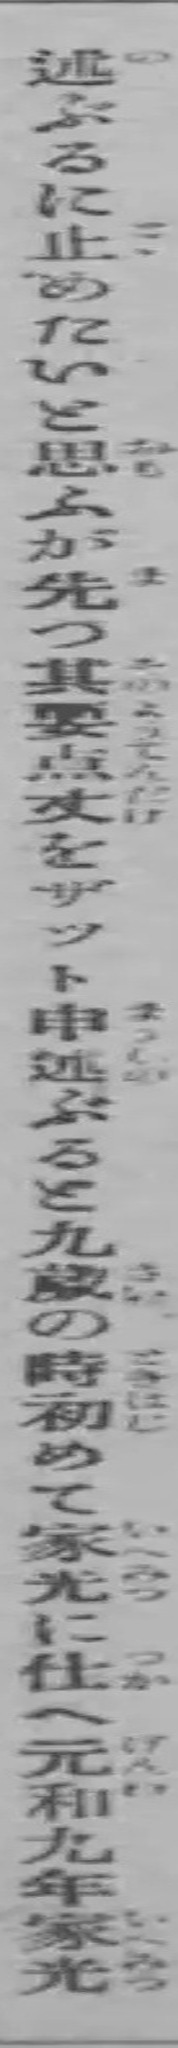述ぶるに止めたいと思ふが先づ其要点丈をザツト申述ぶると九歳の時初めて家光に仕へ元和九年家光
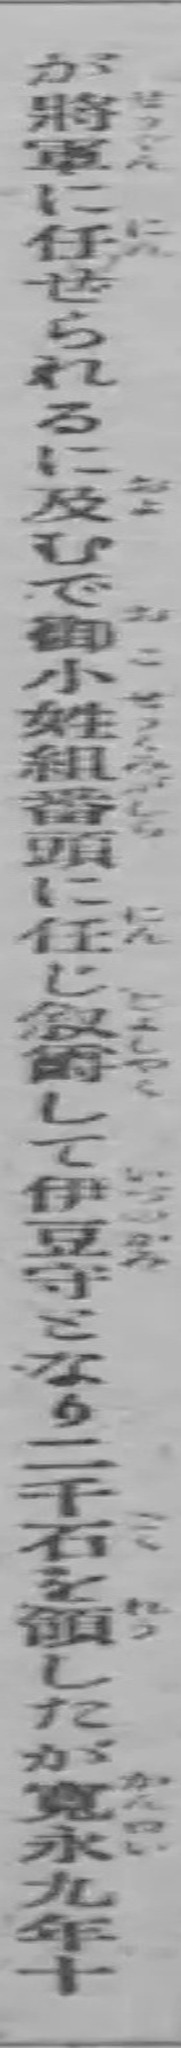が将軍に任ぜられるに及むで御小姓組番頭に任じ叙爵して伊豆守となり二千石を領したが寛永九年十
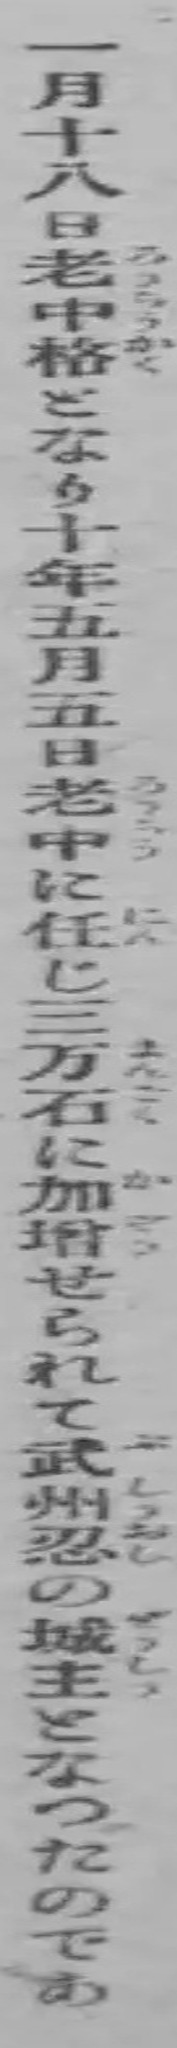一月十八日老中格となり十年五月五日老中に任じ三万石に加増せられて武州忍の城主となつたのであ
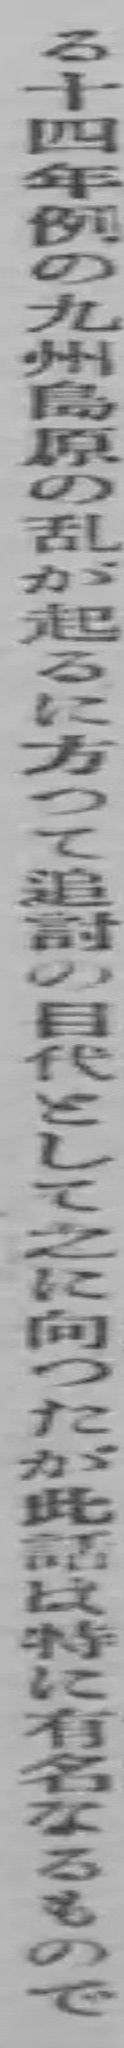島原役る十四年例の九州島原の乱が起るに方つて追討の目代として之に向つたが此話は特に有名なるもので
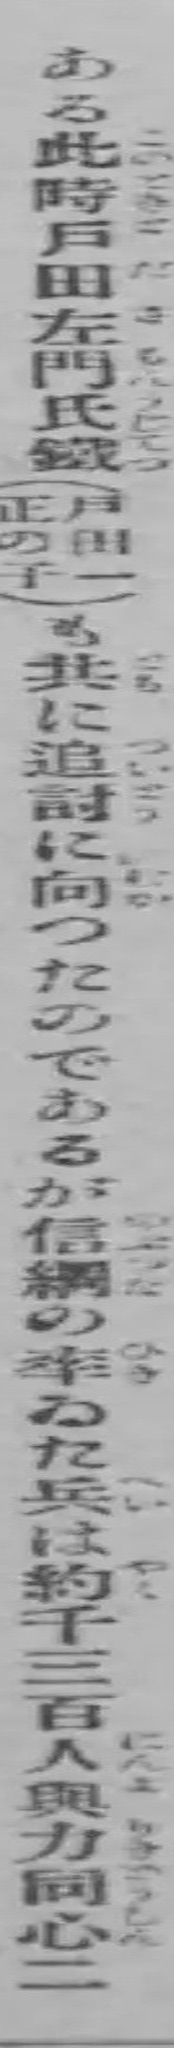ある此時戸田左門氏鉄(戸田一正の子)も共に追討に向つたのであるが信綱の率ゐた兵は約千三百人与力同心二
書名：豊橋市史談
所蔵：国立国会図書館 National Diet Library, JAPAN
